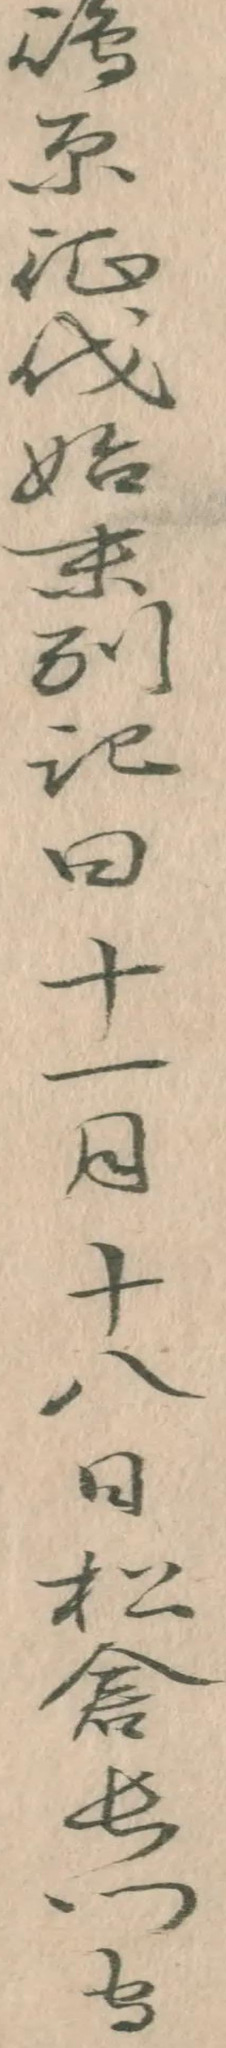島原征伐始末別記曰十一月十八日松倉長門守
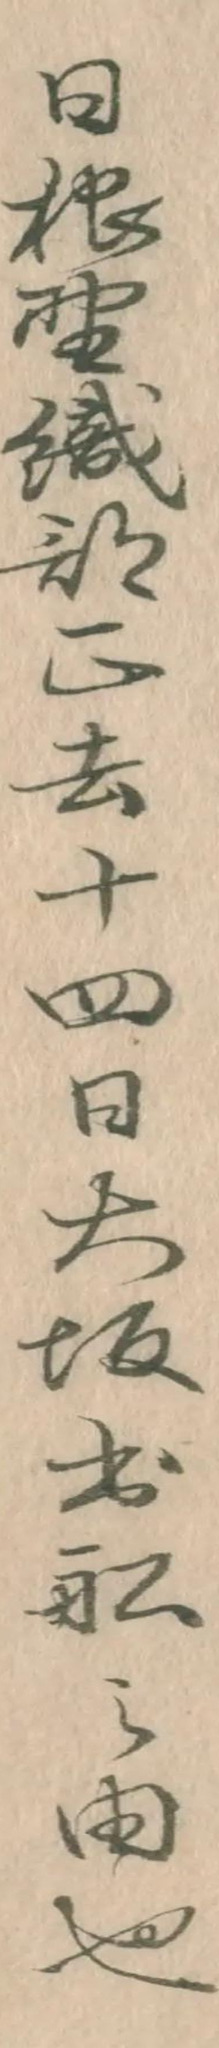日根野織部正去十四日大坂出舩之由也
